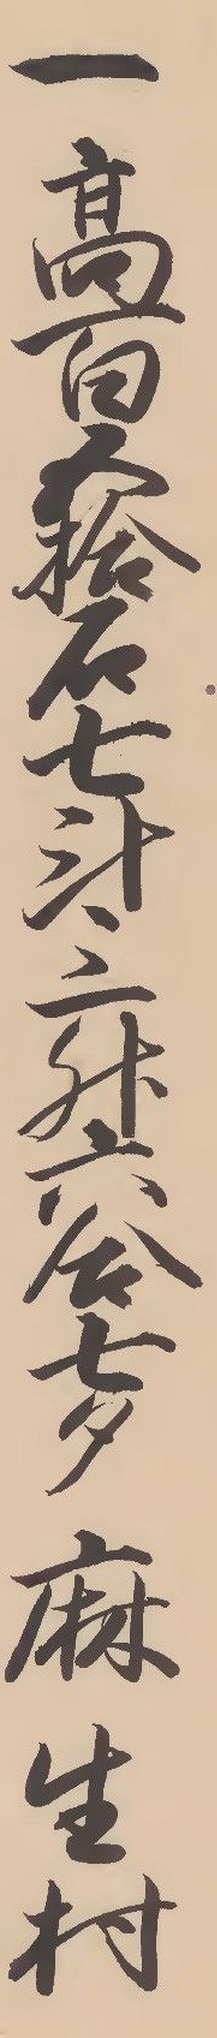一高百五拾石七斗三升六合七勺麻生村
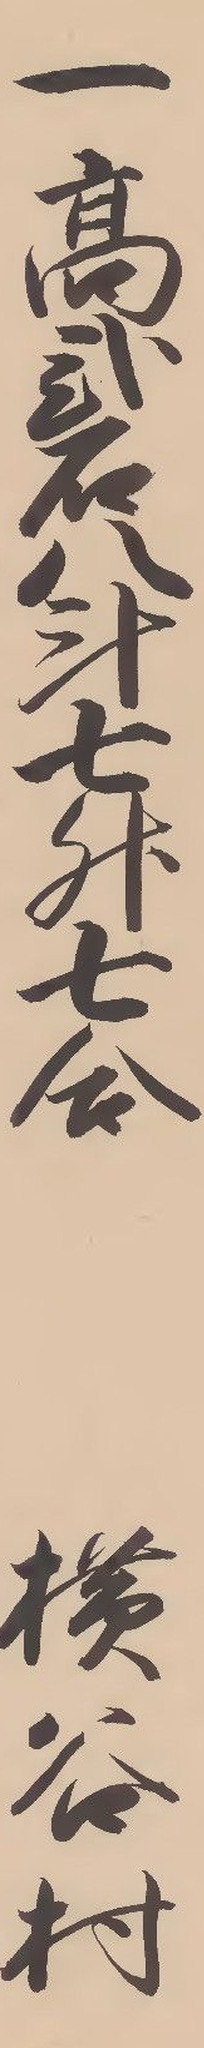一高弐石八斗七升七合横谷村
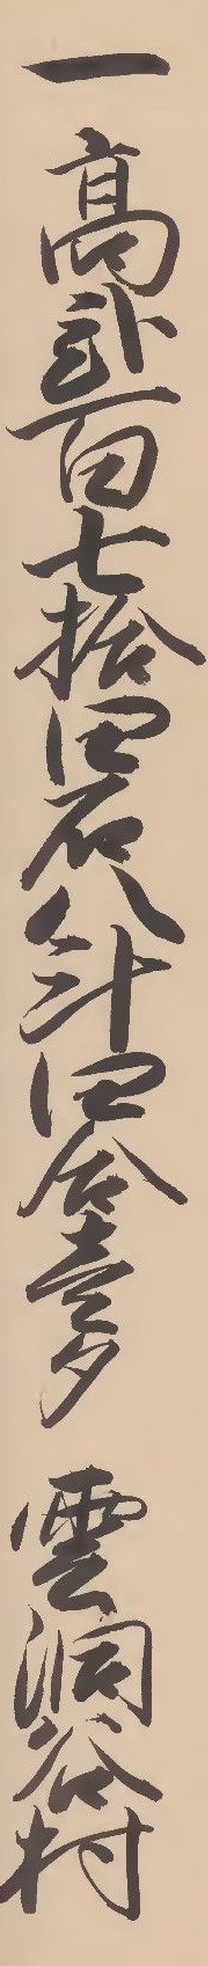一高弐百七拾四石八斗四合壱勺雲洞谷村
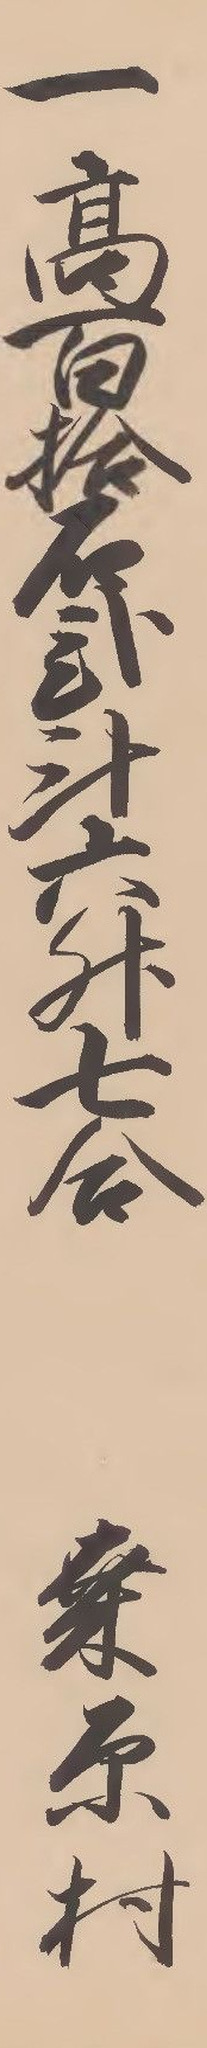一高百拾石弐斗六升七合桑原村
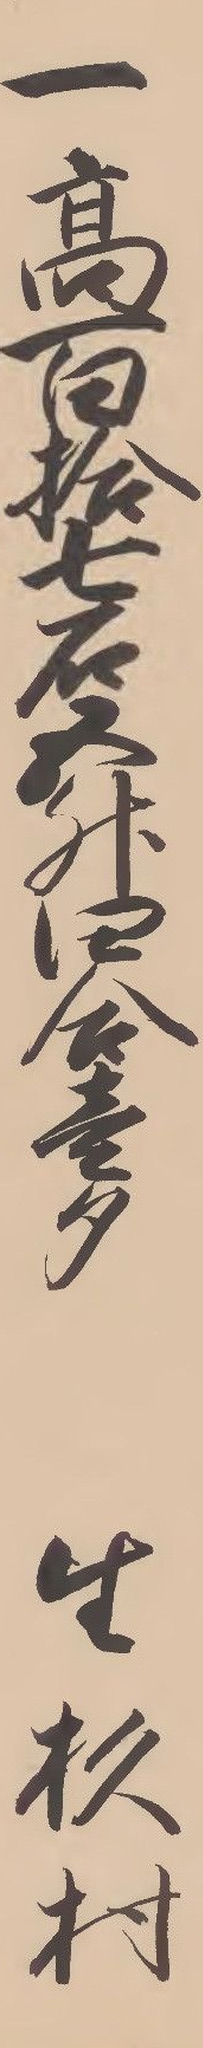一高百拾七石五升四合壱勺生杉村

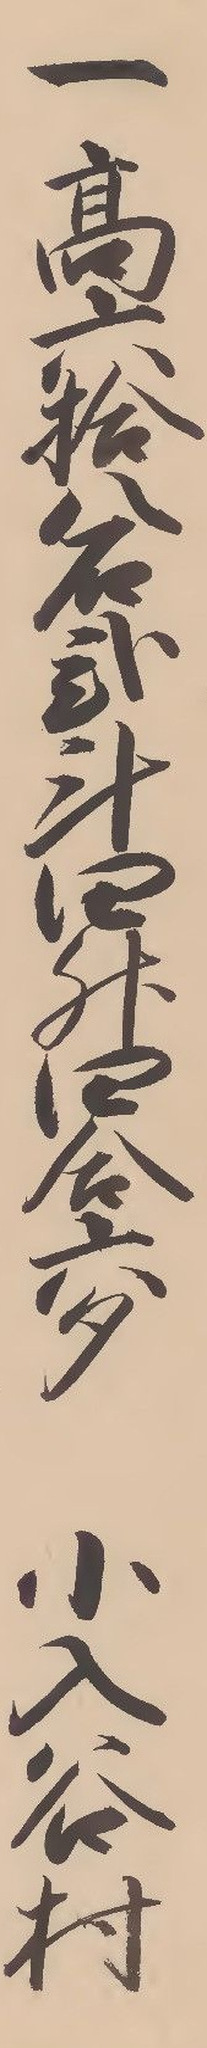一高六拾八石弐斗四升四合六勺小入谷村
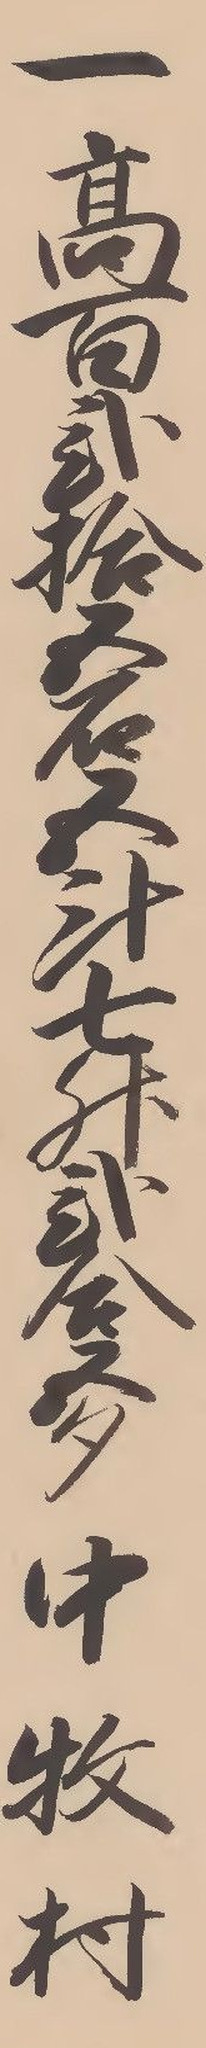一高百弐拾五石五斗七升弐合五勺中牧村
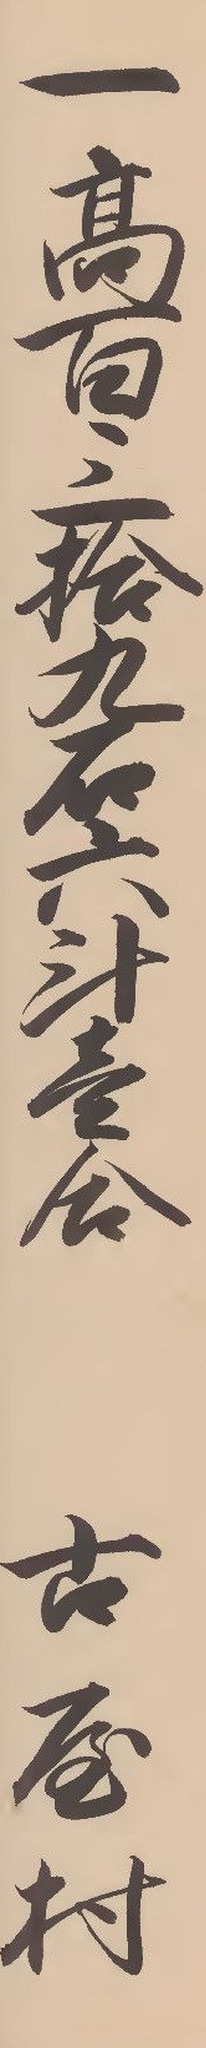一高百三拾九石六斗壱合古屋村
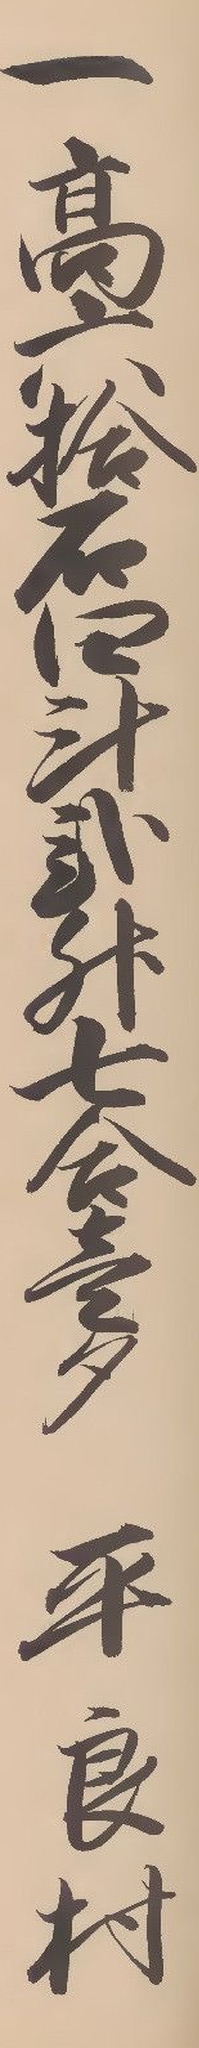一高六拾石四斗弐升七合壱勺平良村
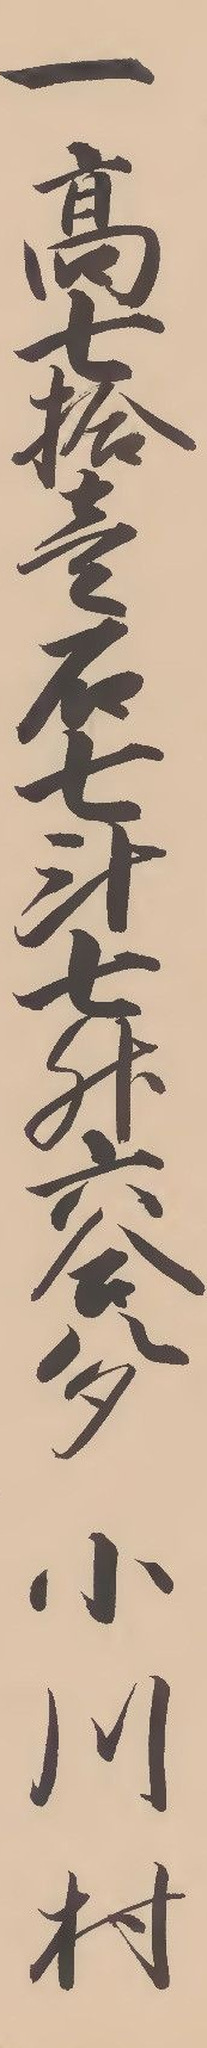一高七拾壱石七斗七升六合八勺小川村
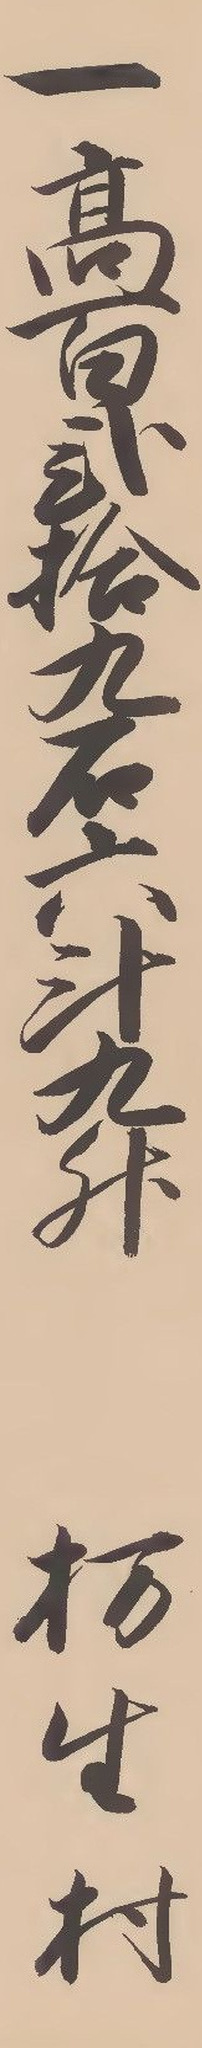一高百弐拾九石六斗九升栃生村
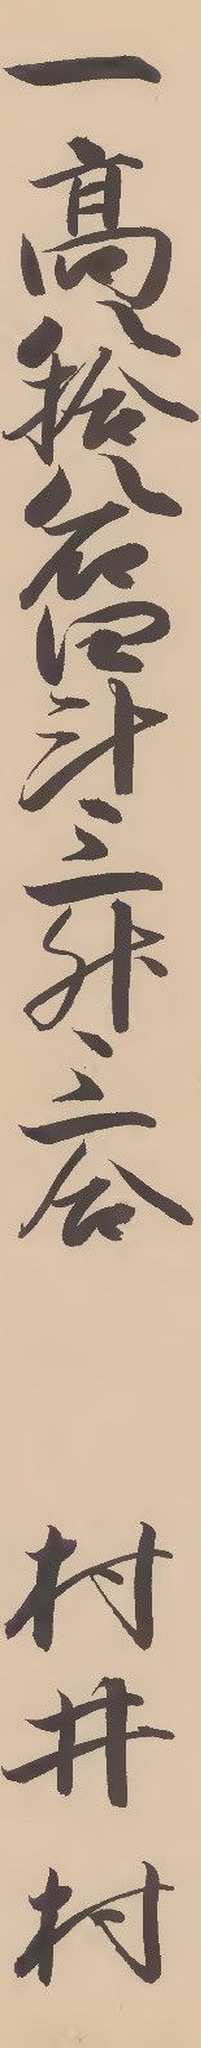一高八拾八石四斗三升三合村井村

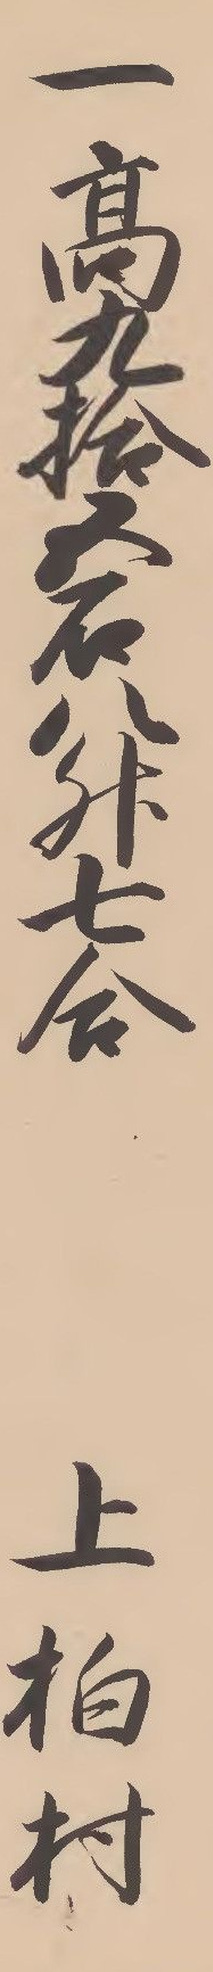一高九拾五石八升七合上柏村
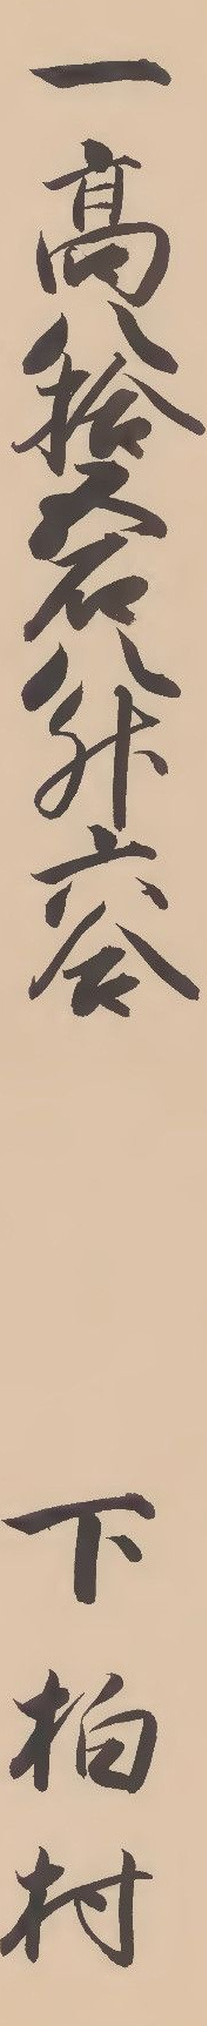一高八拾五石八升六合下柏村
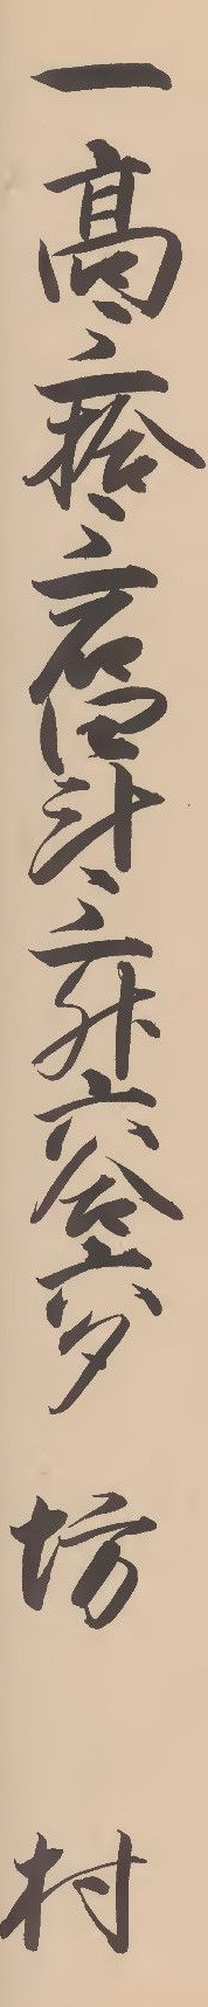一三拾三石四斗三升六合六勺坊村
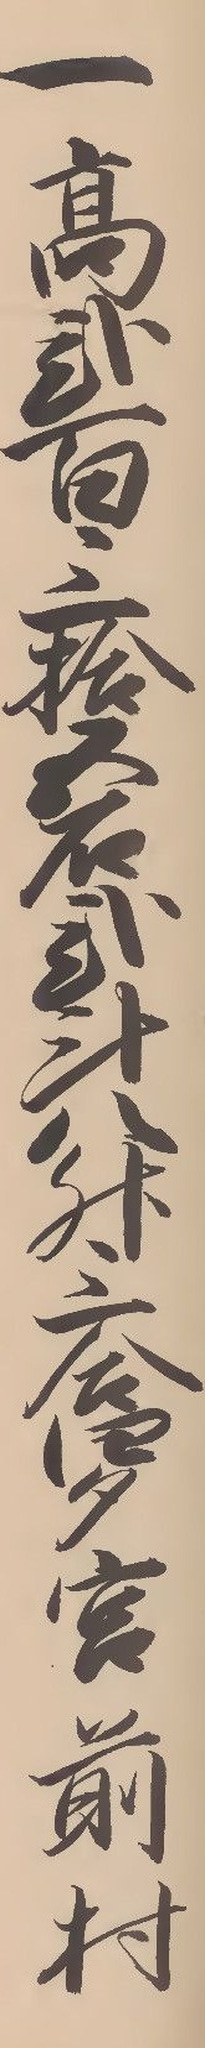一高弐百三拾五石弐斗八升三合四勺宮前村
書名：近江国郷帳
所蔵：国立公文書館 National Archives of Japan
